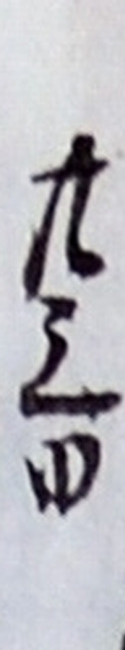廿三日
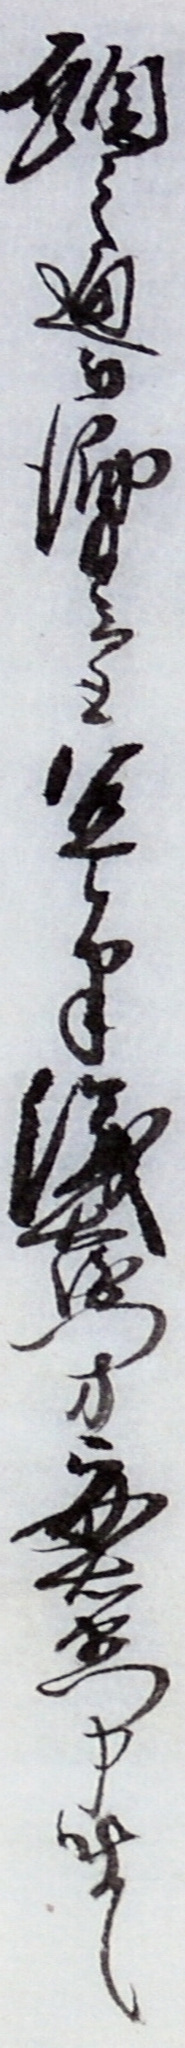願之通被仰付候宜今半儀右衛門共安右衛門申聞候
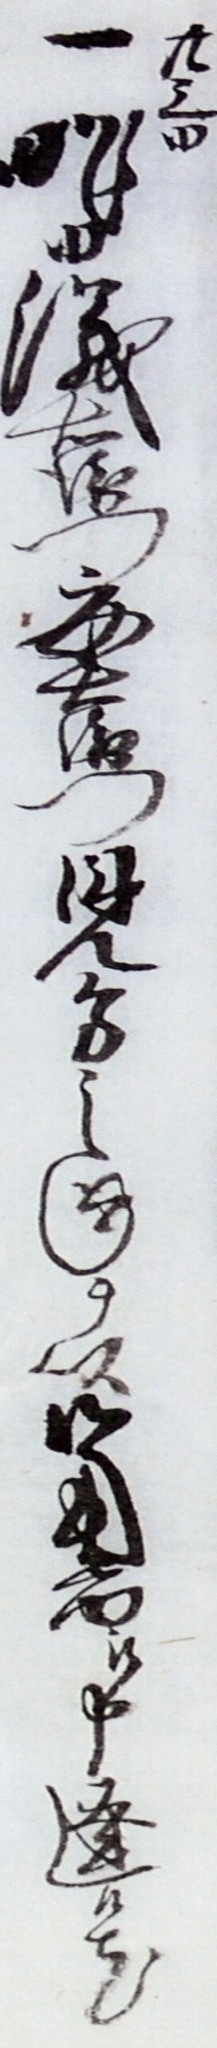一昨日儀右衛門安右衛門見分之趣を以御用宿江申達候尤
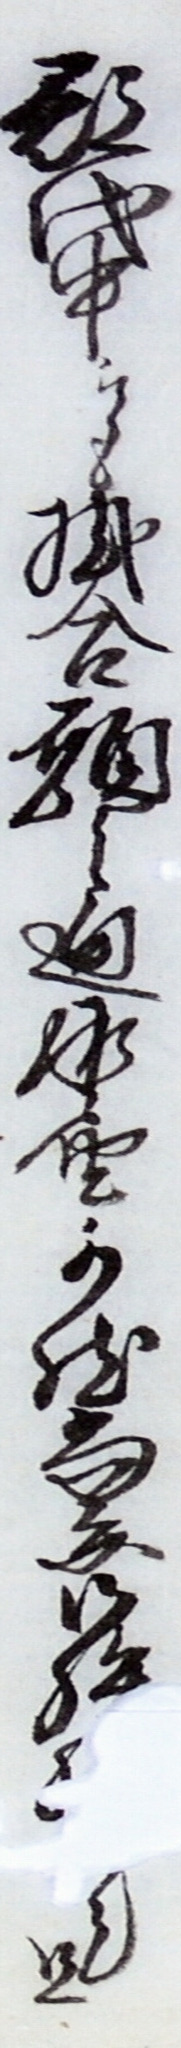郡代中江もヲ掛合願之通承届可然尚亦御之通
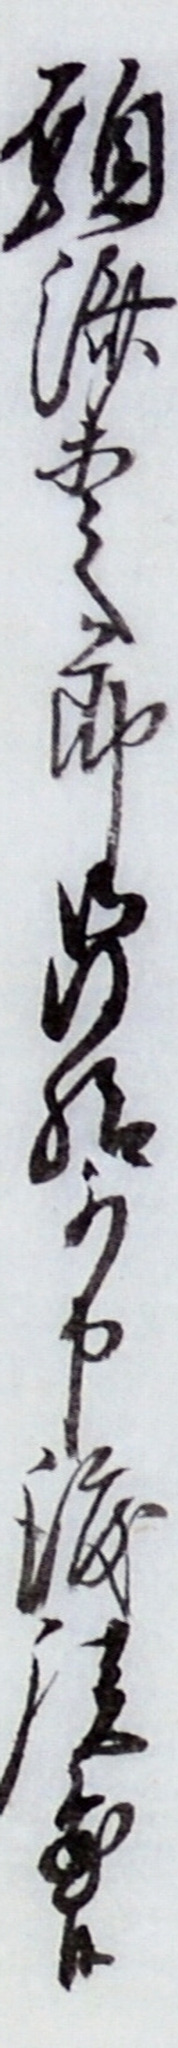願済等之節御同様可申渡置候
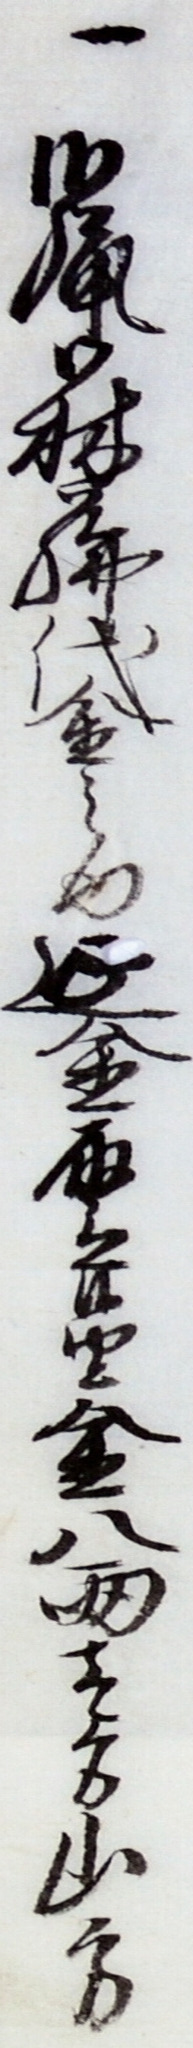一御猟御林御払代金之内返金届有候由金八両壱方山壱

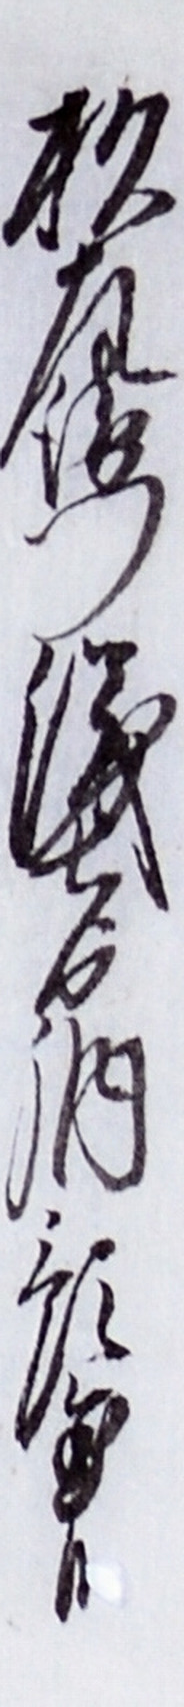杉左衛門儀七より納預置候
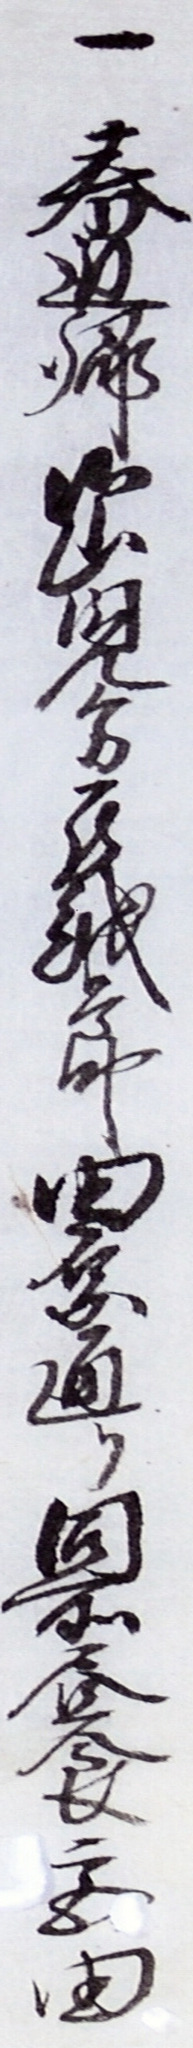一春近郷御山見方罷越候節田原通り同所昼食宮田
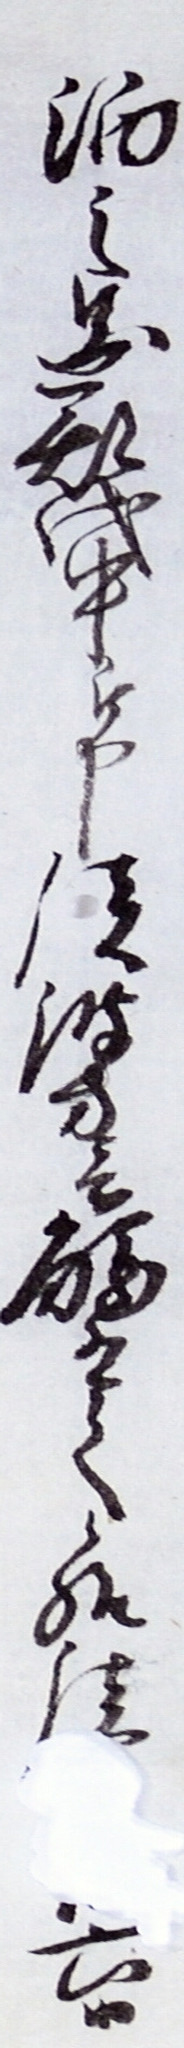泊之図郡代中被申淡彼方ニ而触有之候様談六日
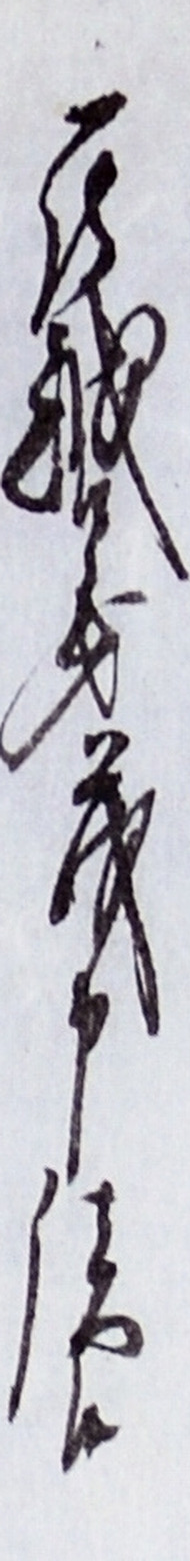罷越候義も申談候
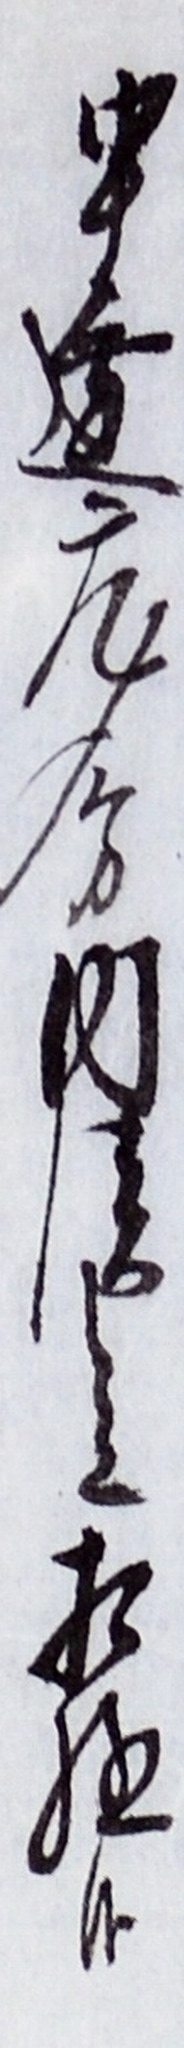申達元〆方内談之上相極候
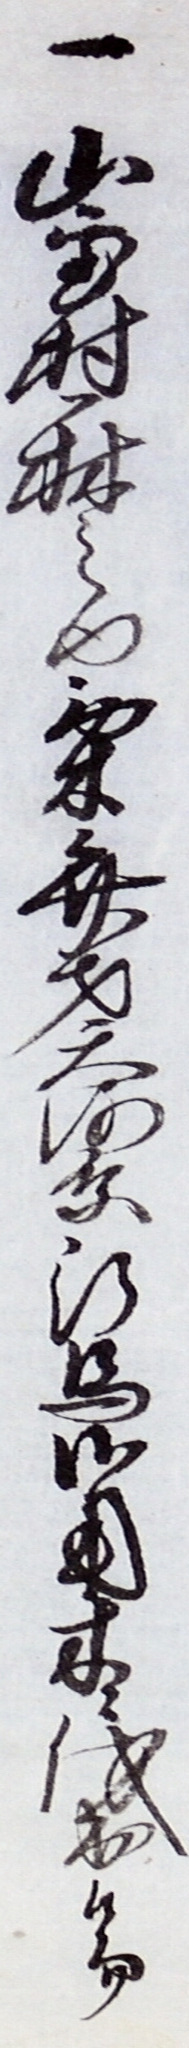一山宝村林之内栗弁才天河原行馬御用木之儀出候而
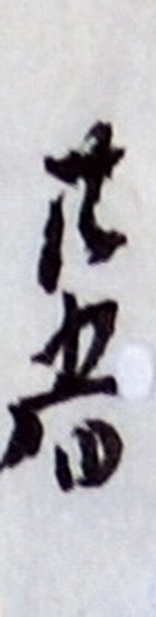廿五日
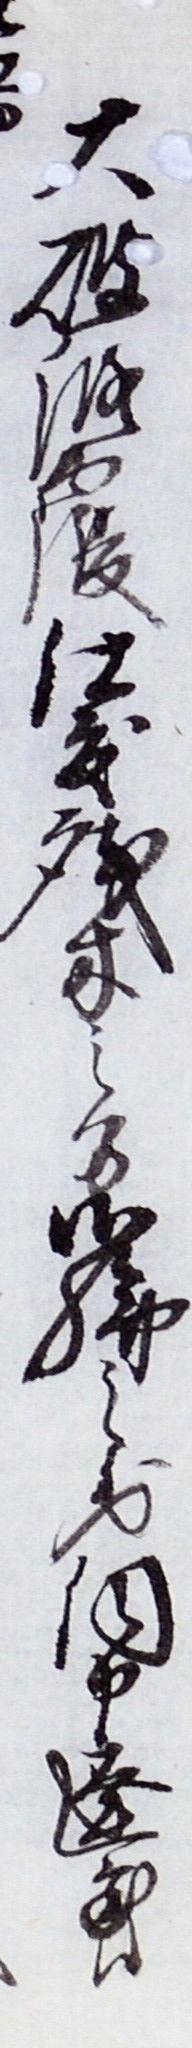大破修覆仕度残木之分御払之者伺申達候
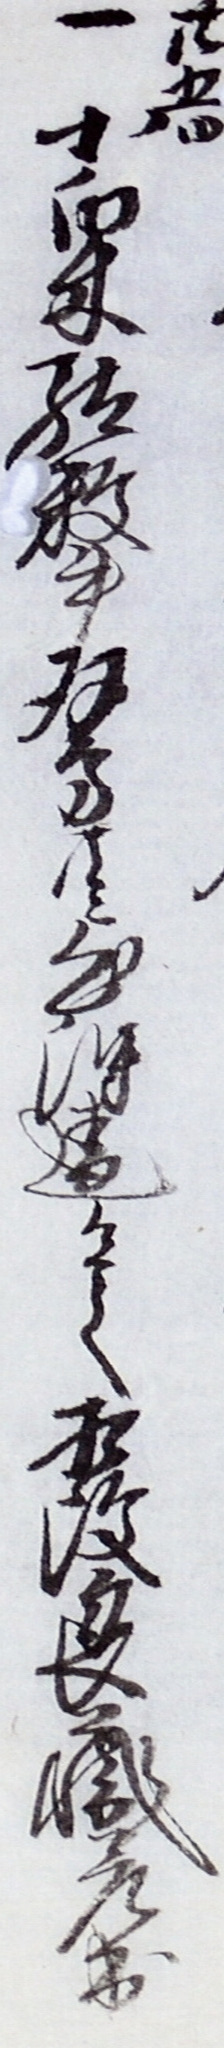一小白木駄数斗双方共心津遣有之相改家長蔵差出
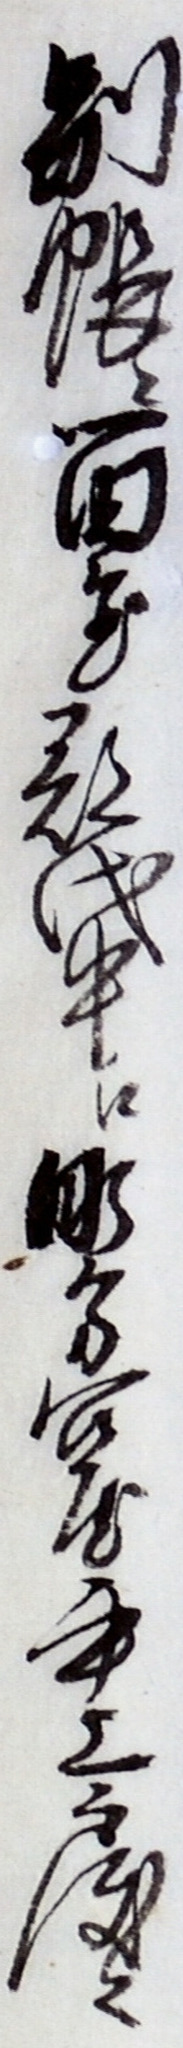別帳ニ留置郡代中江町方問屋書上渡候
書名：御山奉行御用控
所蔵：伊那市立高遠町図書館・合同会社AMANE
